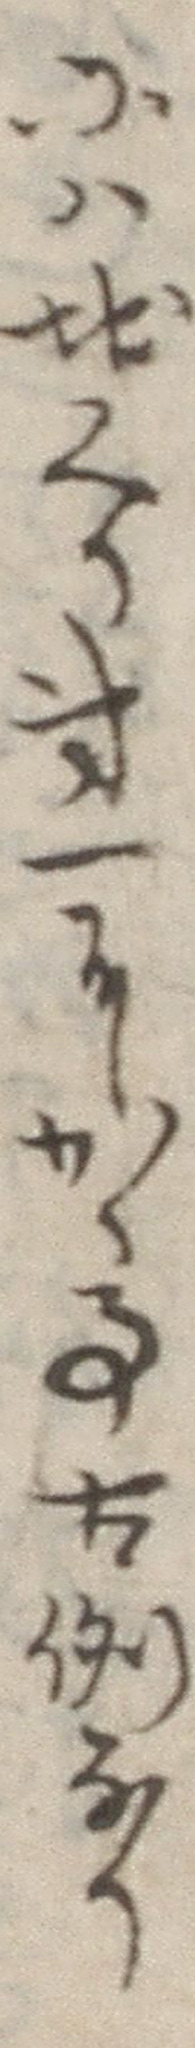には地くり第一にかく事古例なり
